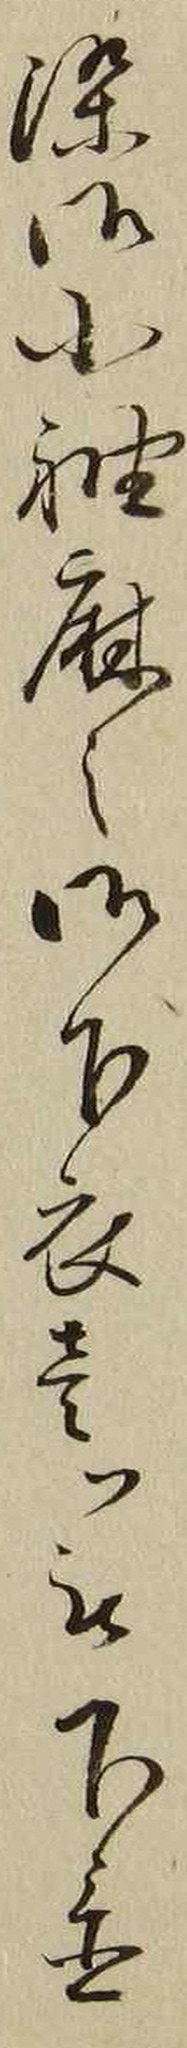染御小袖麻の御下衣壱ツ被下置
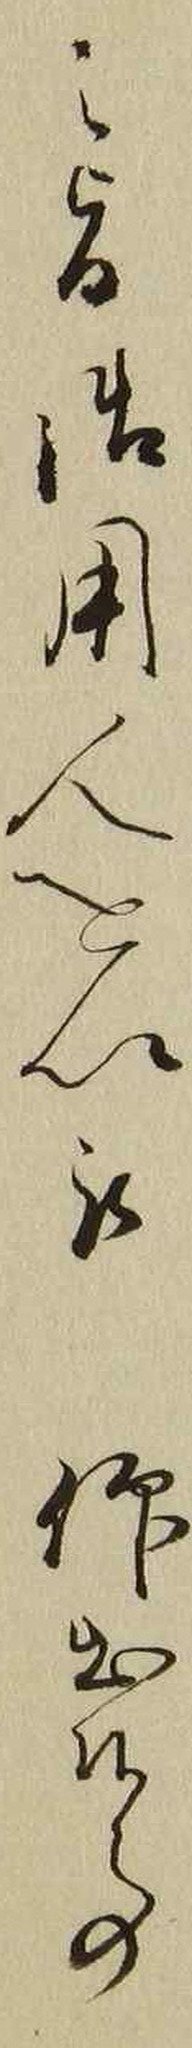の旨御用人を以被仰出候事
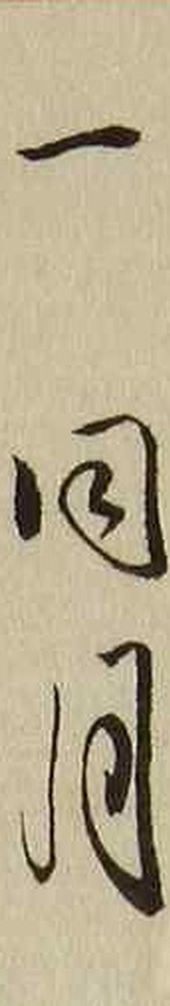一同月
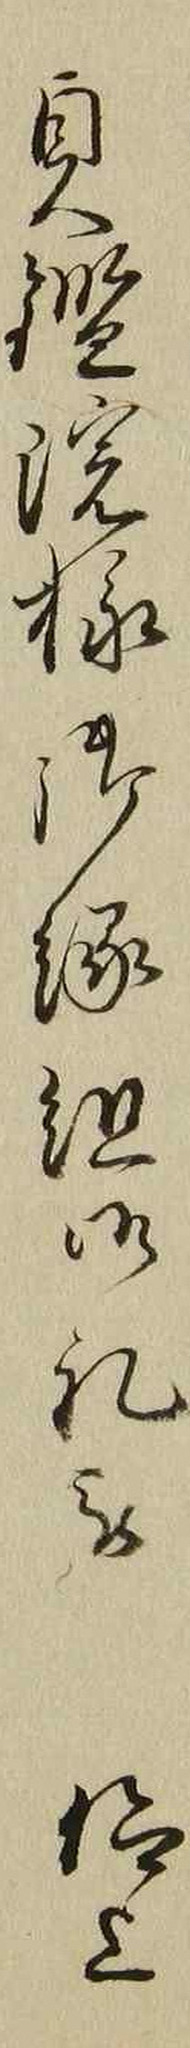貞鑑院様御縁組御礼被仰上
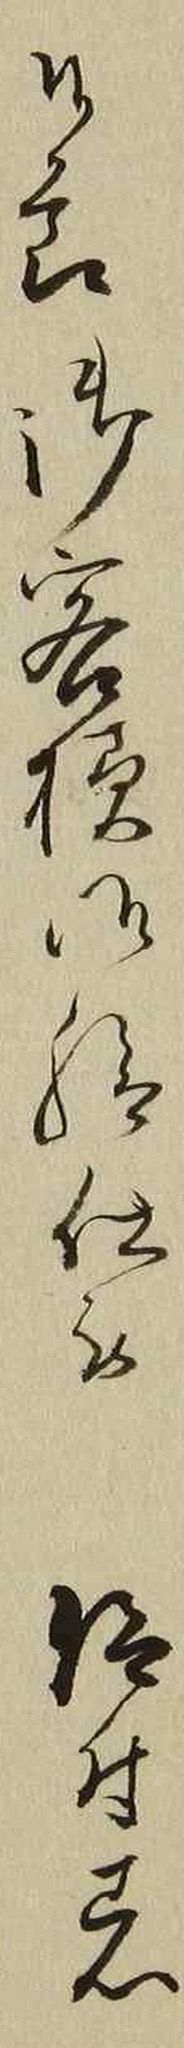候節御客様御給仕被仰付着
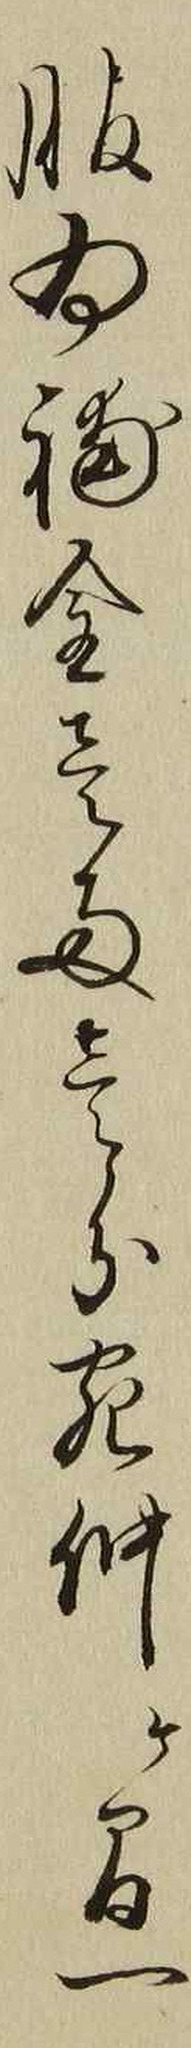服為補金壱両壱分宛仲ケ間一
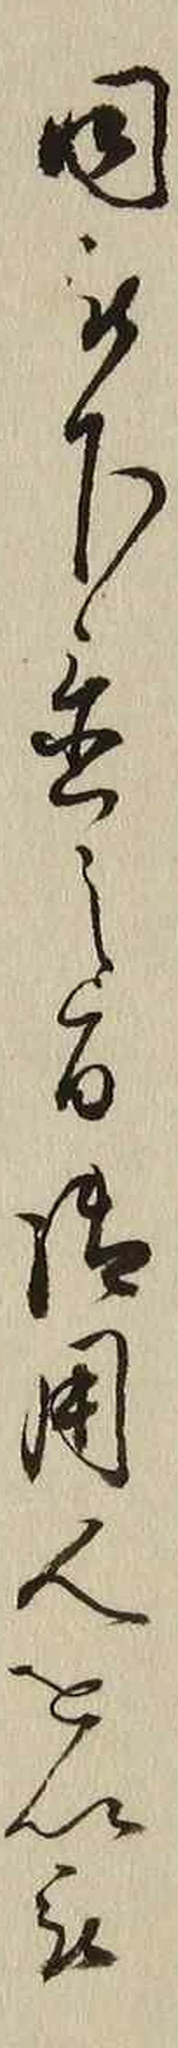同被下置の旨御用人を以被
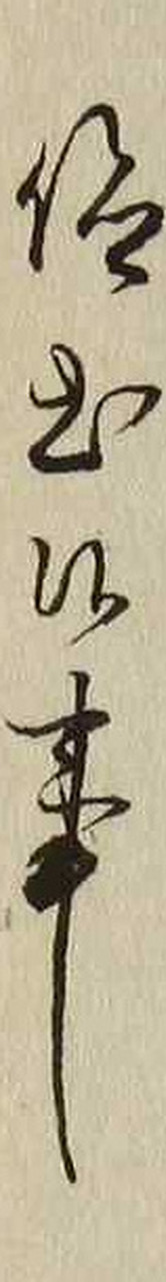仰出候事
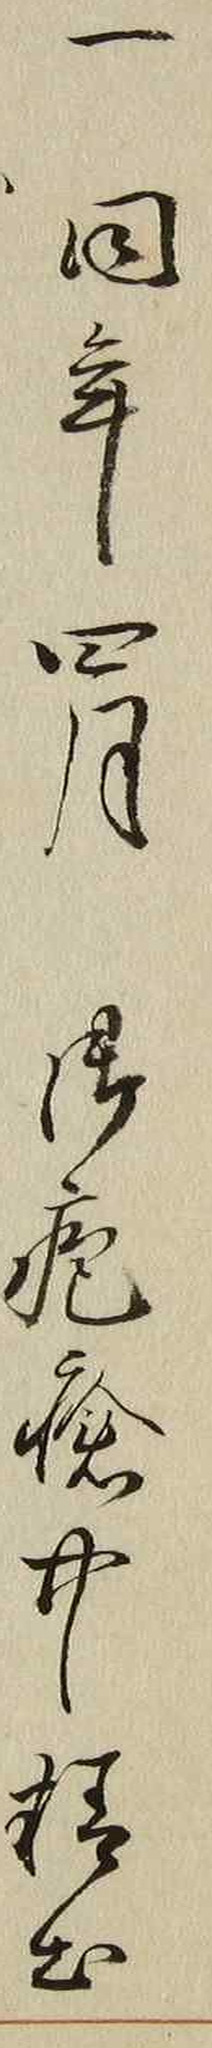一同年四月御疱瘡中精出
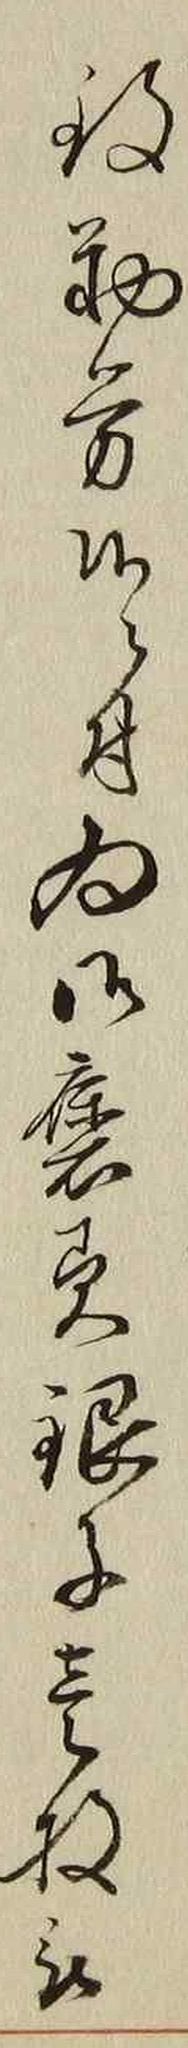致勤労候に付為御褒美銀子壱枚被
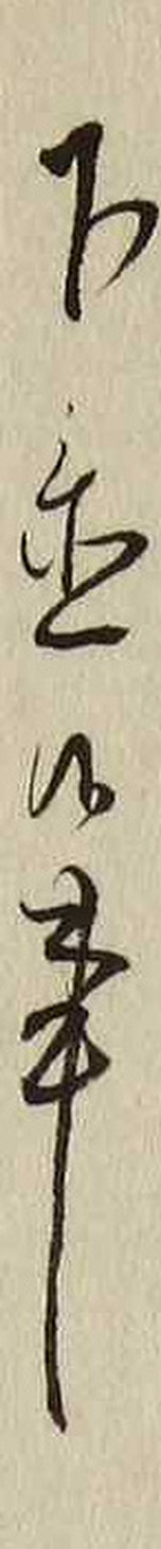下置候事
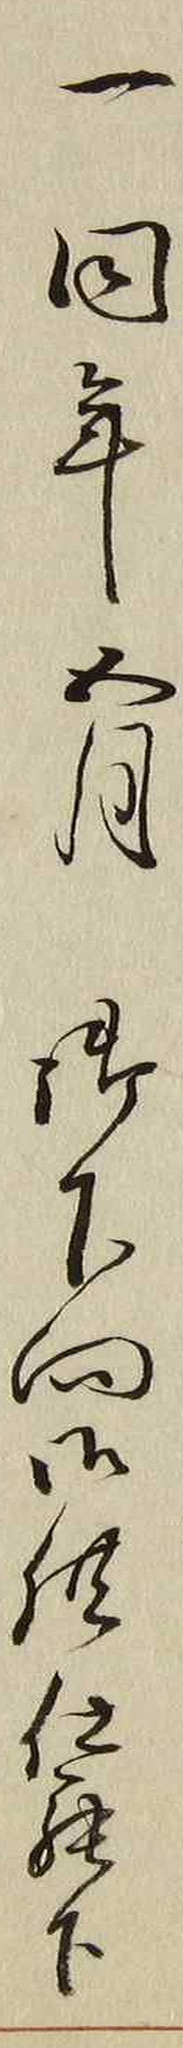一同年五月御下向御供仕罷下
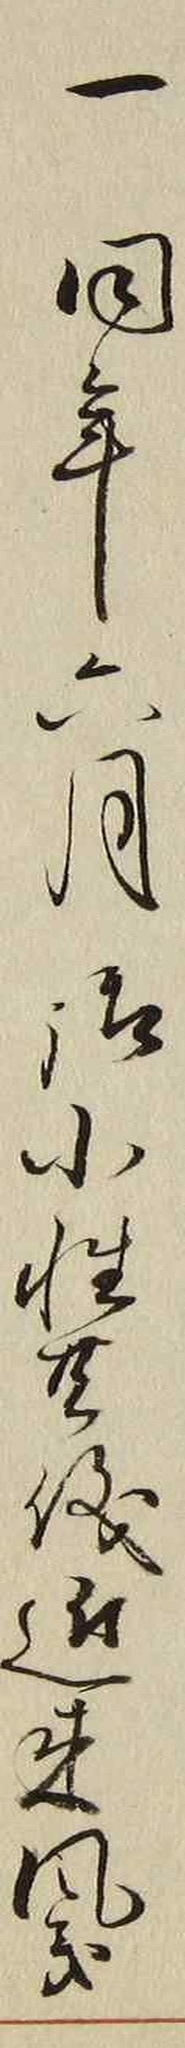一同年六月御小性共儀近来風義
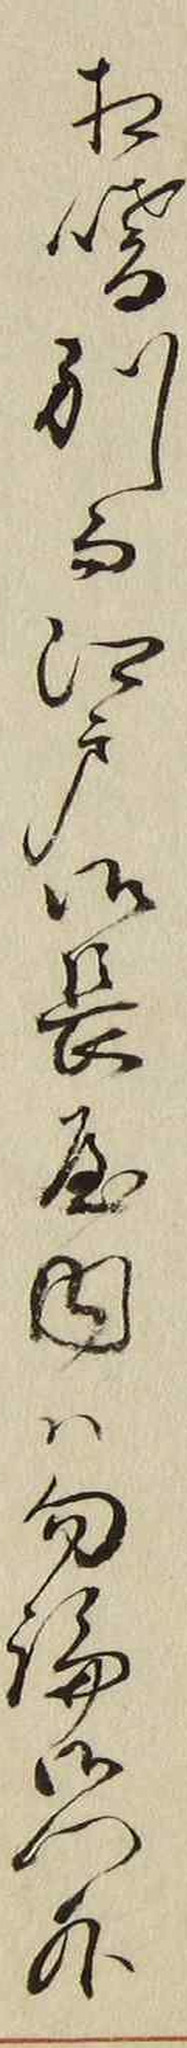相嗜別而江戸御長屋内は勿論御門外
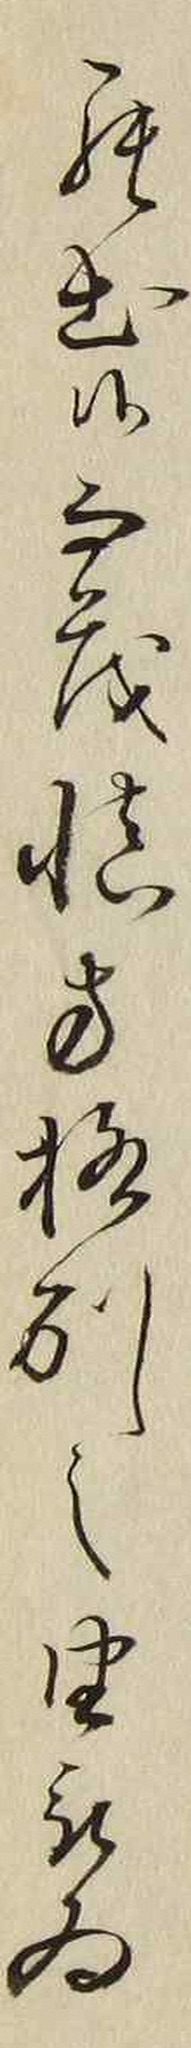罷出候而も慎方格別の由被為

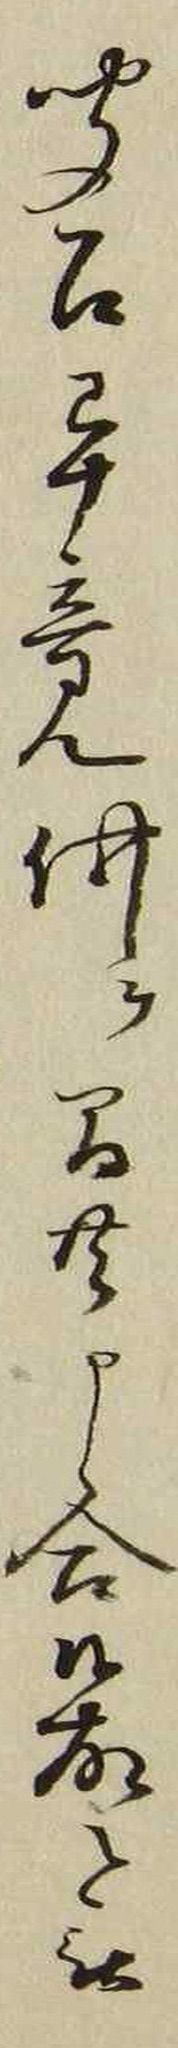聞召畢竟仲ケ間共申合候故と被
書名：諸士系譜　巻之1　い之部1
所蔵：会津若松市立会津図書館
